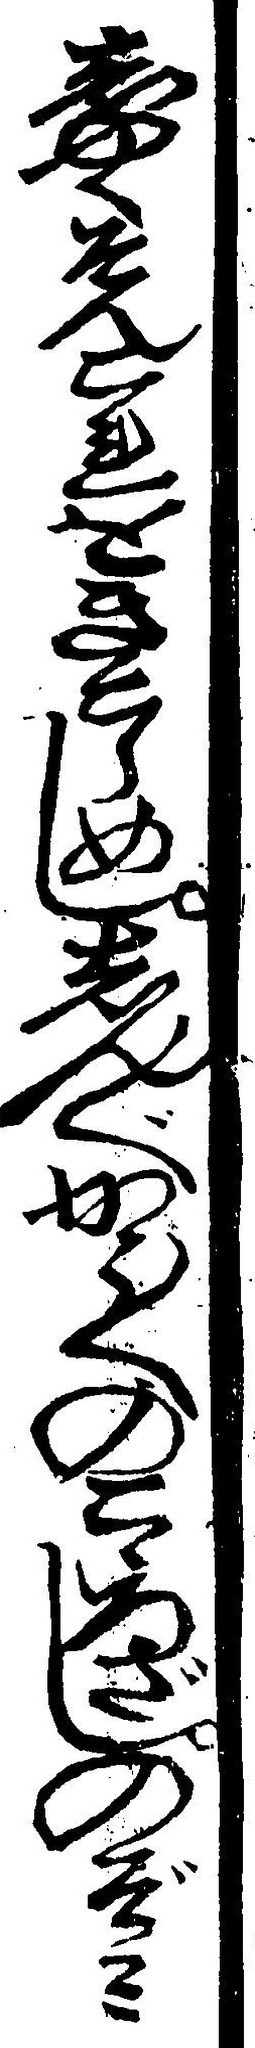しやくそんこれをきこしめし。しん〴〵かう〳〵のこゝろざし。のぞみ
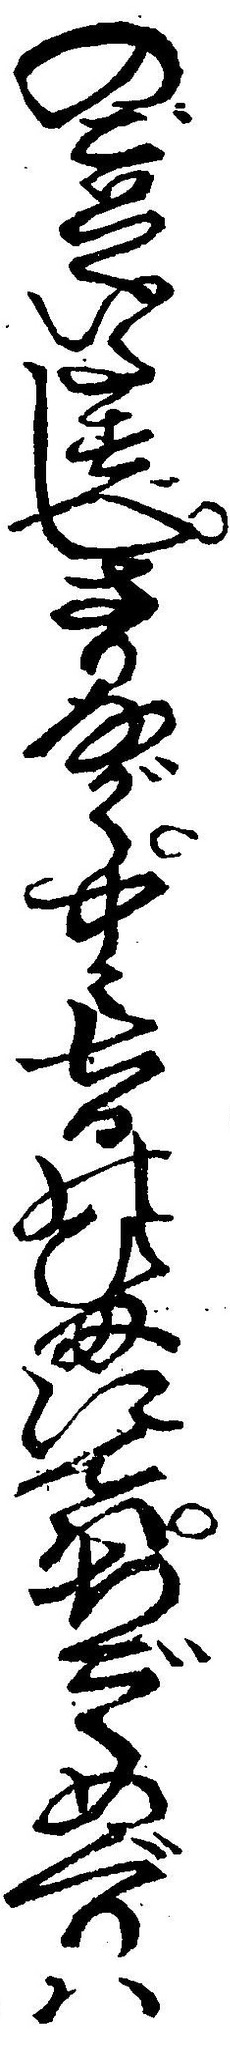のごとくいたすべし。さりながら。中々七日のひまにては。ちごくめぐりは
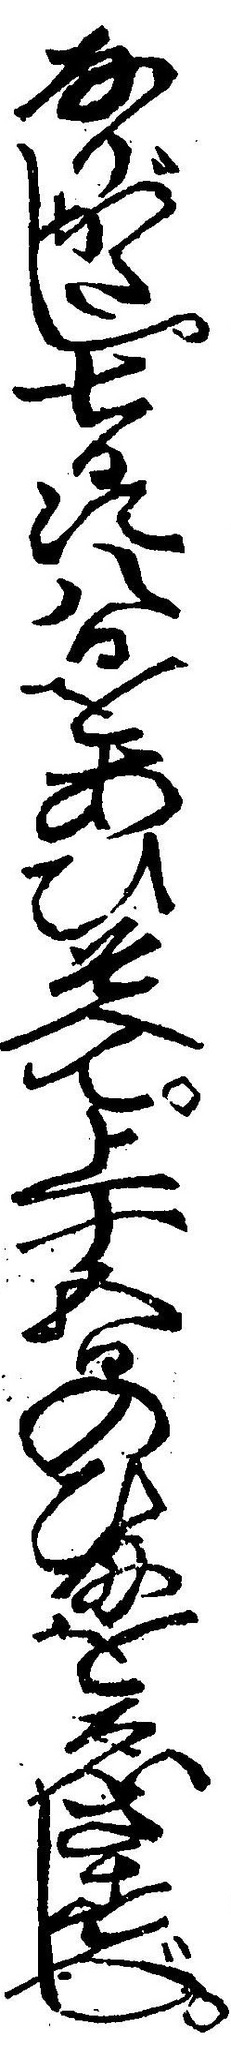なりがたし。七日に八日をあひそへて。上十五日のひまをゑさすべし。
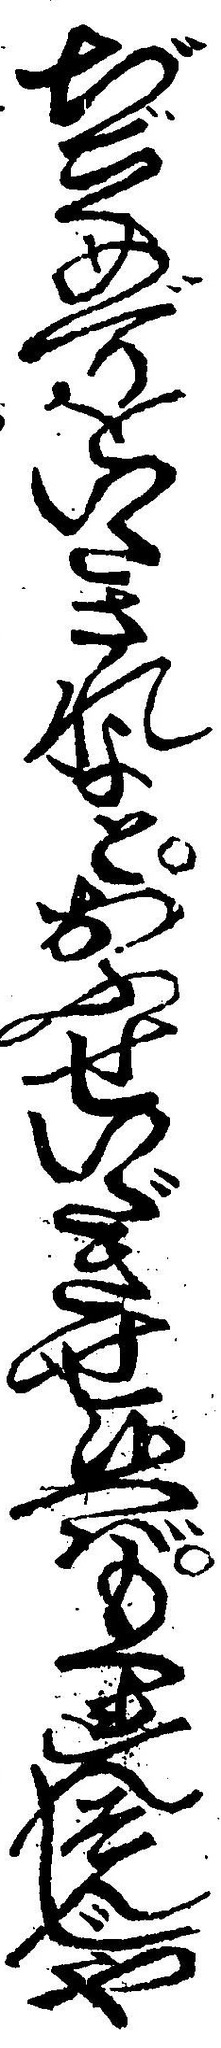ぢごくのめぐりをいたされよと。おふせいだきせ候へば。もくれんそんじや
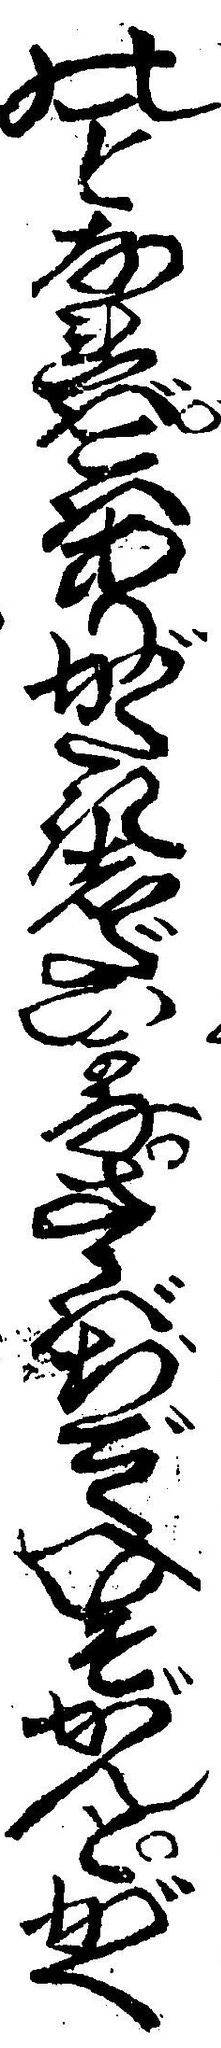のことなれば。こはありがたきしだいかな。さらばぢごくへいそがんと。がく
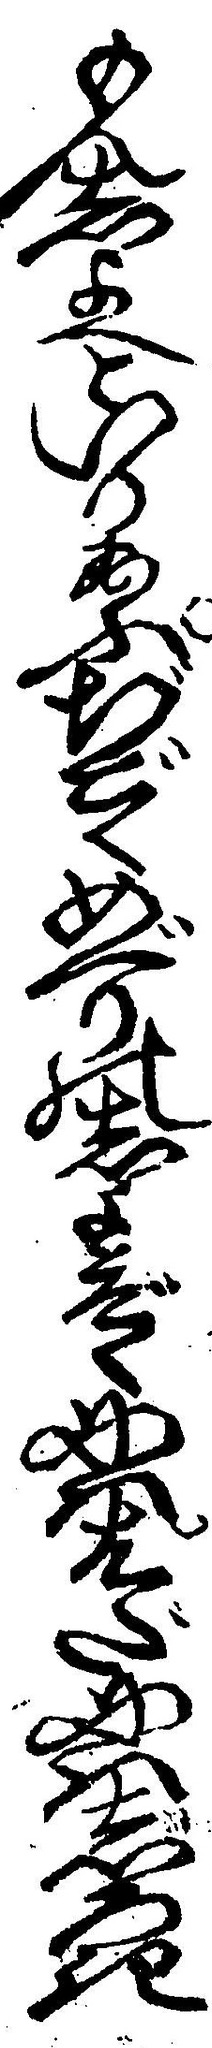もんしよへといり給ふ。ぢごくめぐりのしよぞくてには。はだにはしろき
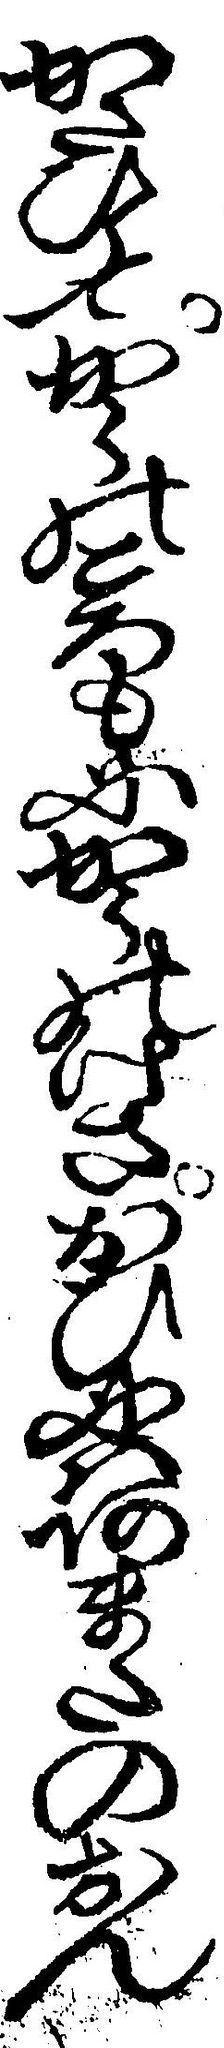かたひらて。からのころもにからのけさ。おひにはあまたのおん
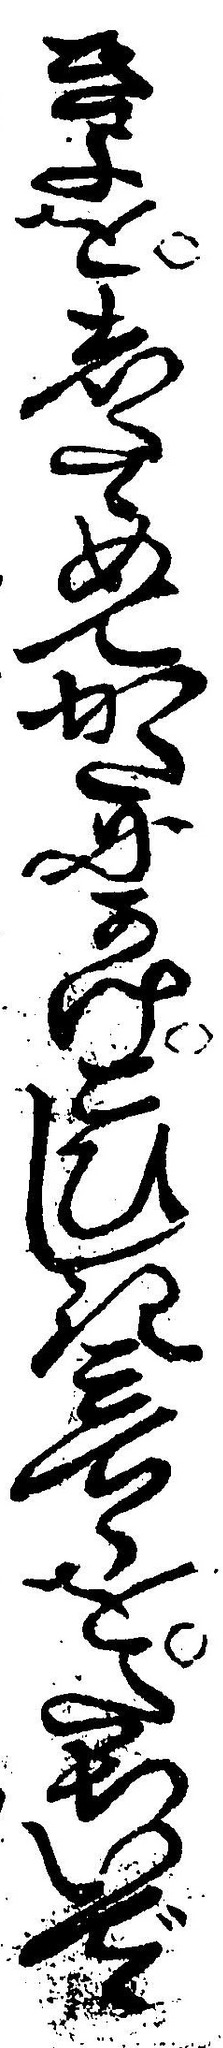きよを。したゝめてかたにかけ。こひしきみてらを。たちいでゝ

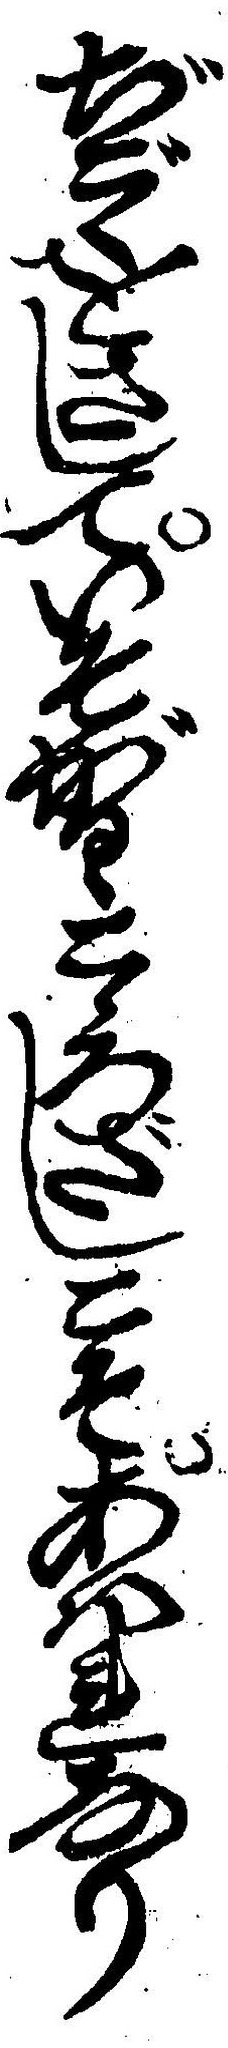ぢごくをさして。いそがるゝこころざしこそ。あはれなり
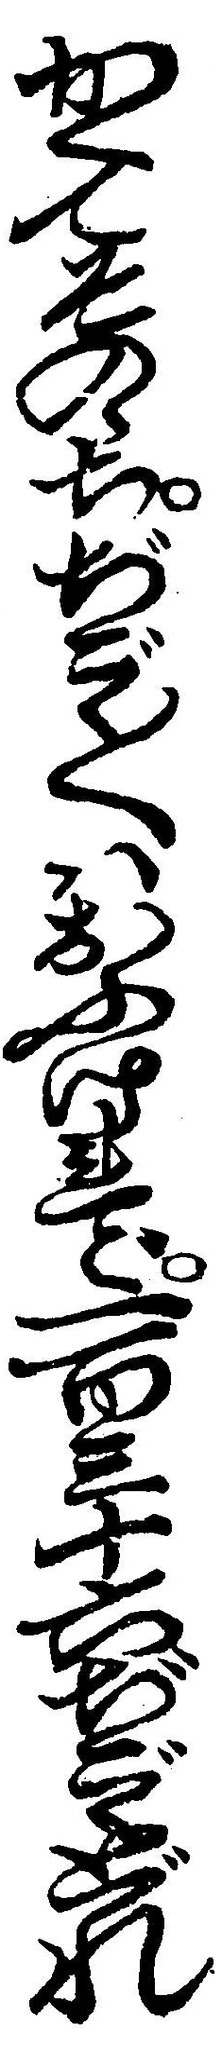かくてそのゝち。ぢごく〳〵はおふけれど。一百三十六ぢごくどれ
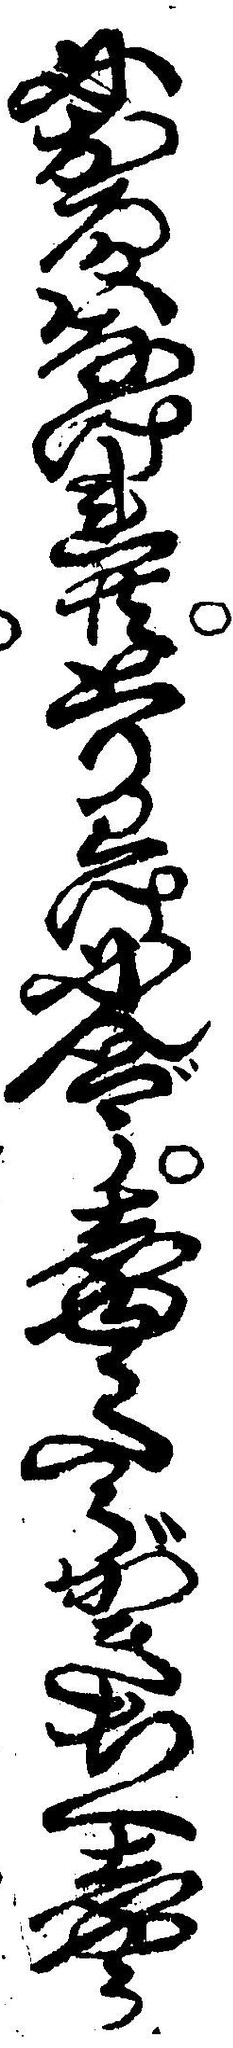におろかはなけれ共。とりわけにんどう。しゆらたうがきちくしやう
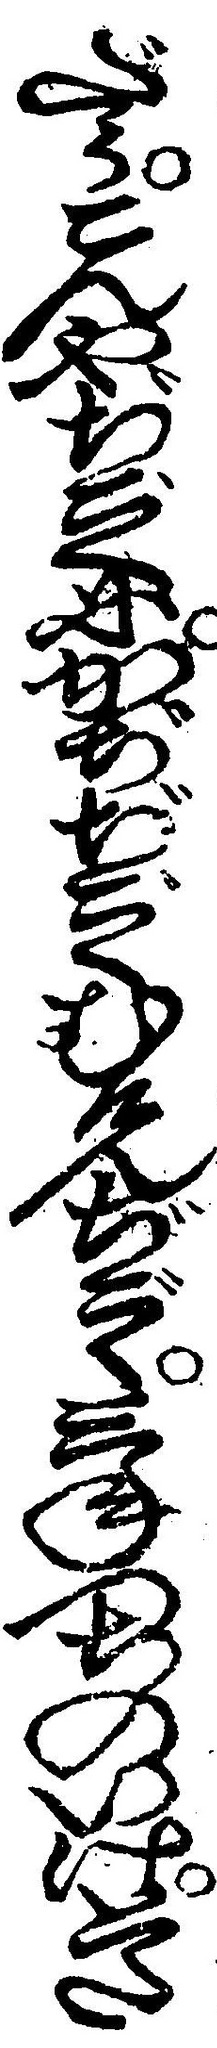だう。こんやぢごくに。かぢぢごくむけんぢごく。三ねつちのいけ。とた
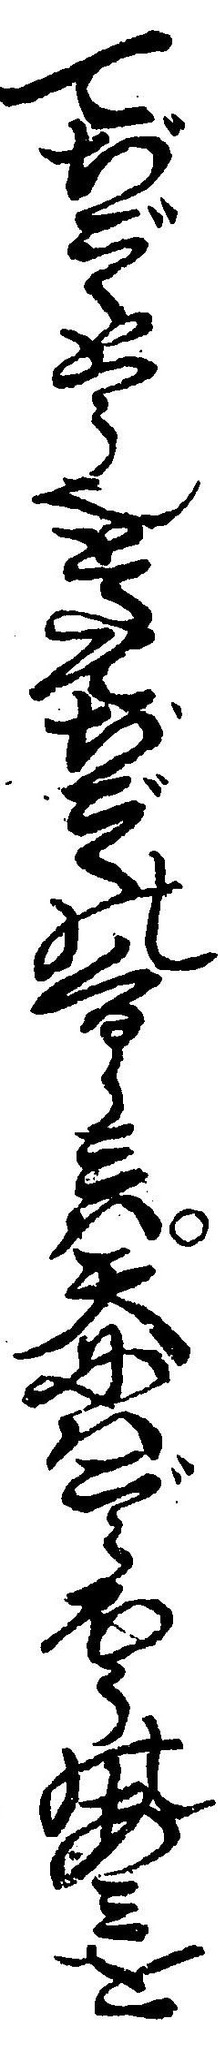てぢごくとう也とたてぢごくのくるしみは。天にはごうほうのあみを
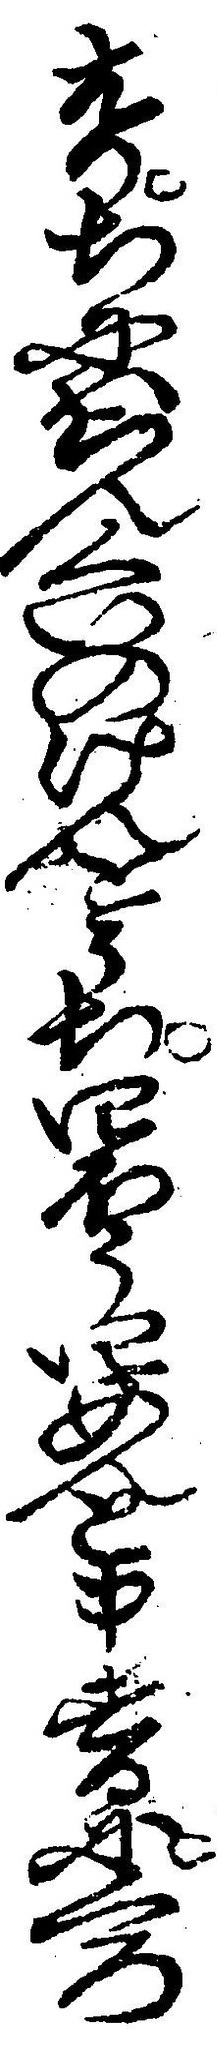はり。ちにはらんくいのけんをうち。四ほう四めんと申るに。くろ
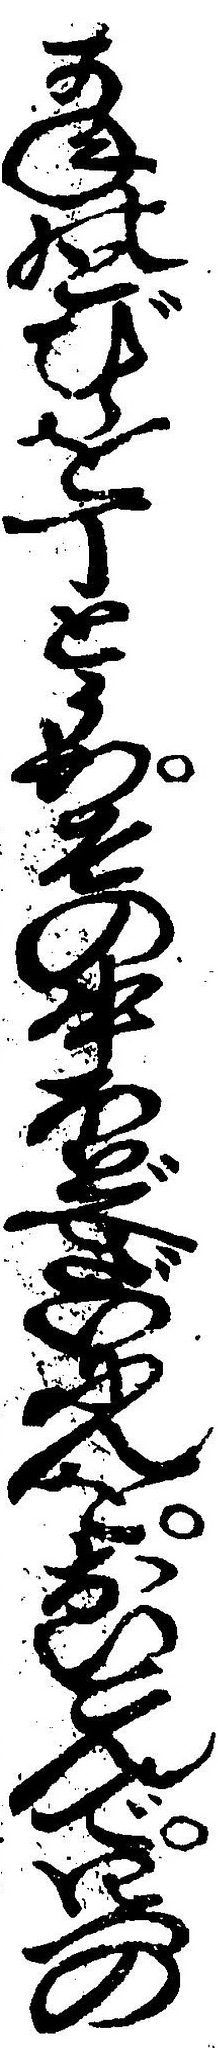かねのとびらを丁とうち。その中ほどへざいにんを。おいこんで。四つの
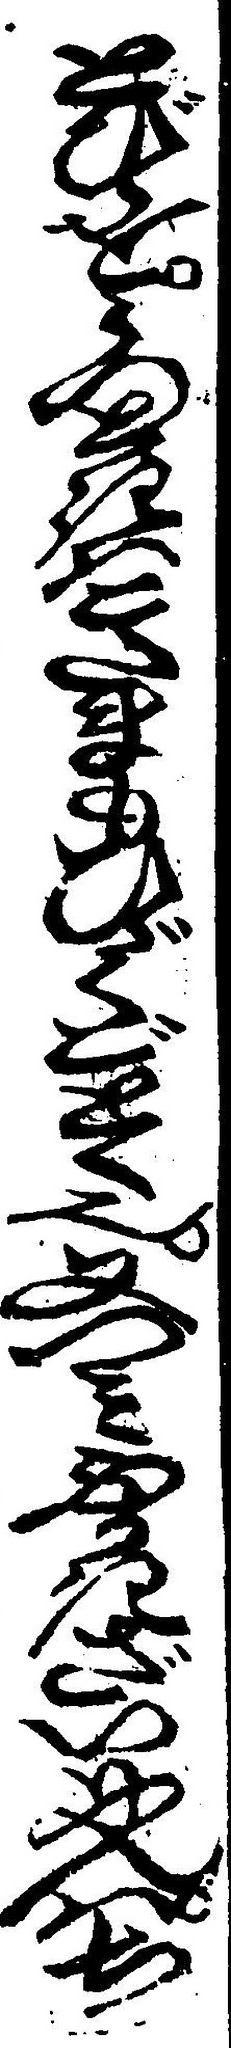とびらを。うつときはこたまもひゞくごとく也。又つみふかきざいにんは。ち
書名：目連尊者地獄めくり / 宇留藤太夫正本
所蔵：東京大学総合図書館 General Library in the University of Tokyo, JAPAN
